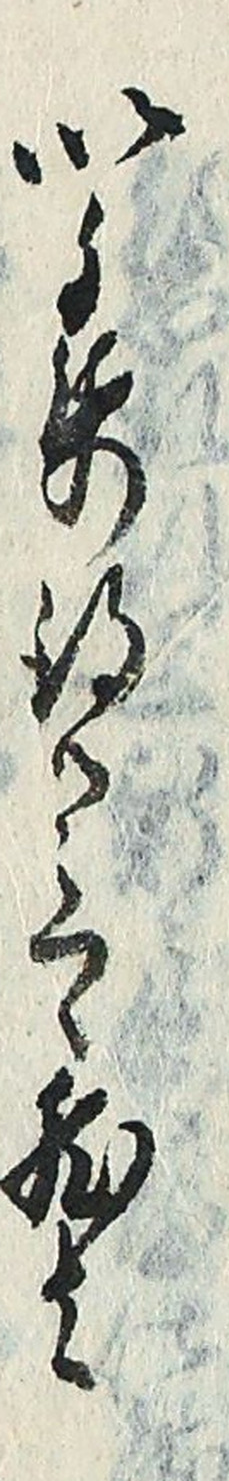以手帋得御意候然者
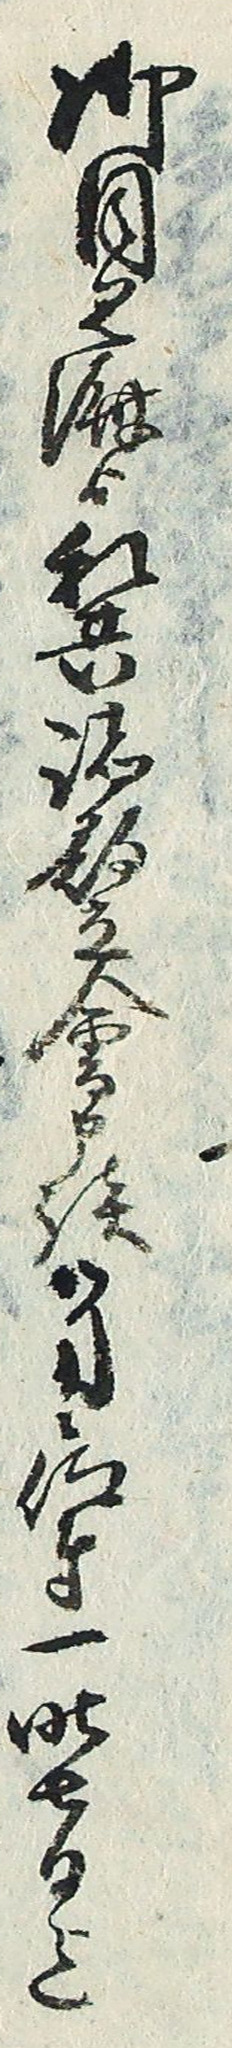御目見濟ゟ私共諸郡立會申談御用被仰付一昨七日迄
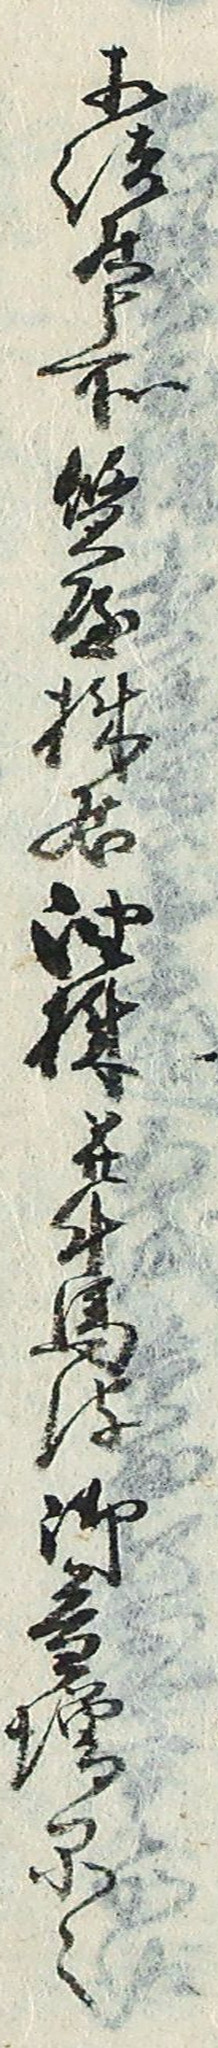相談居申所質屋株居油株幷牛馬皮御益増品々
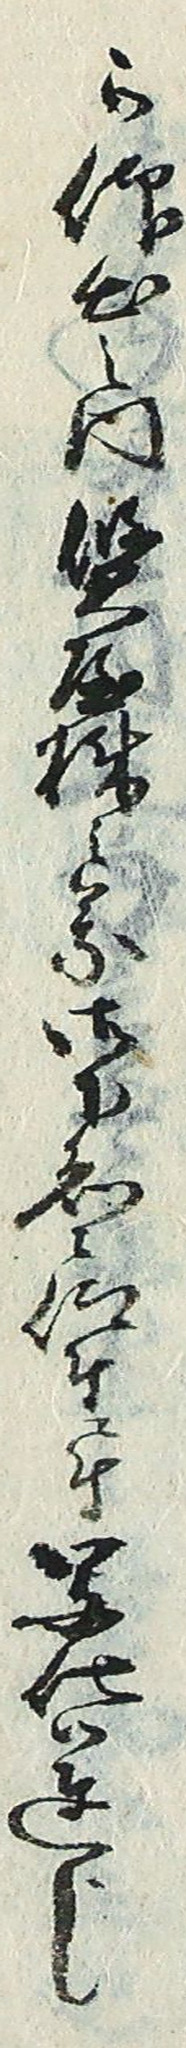被仰出之内質屋株之義御下知被仰付ニ付写仕御達申候
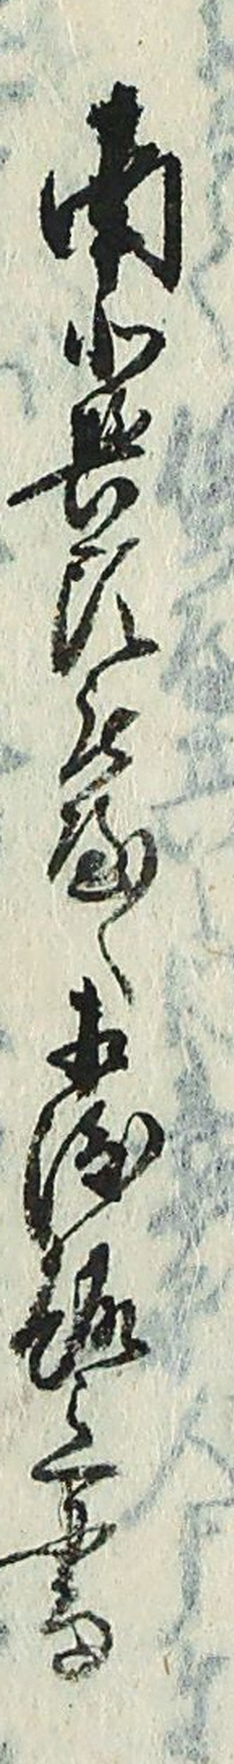南北與頭庄屋へ相渡趣上書
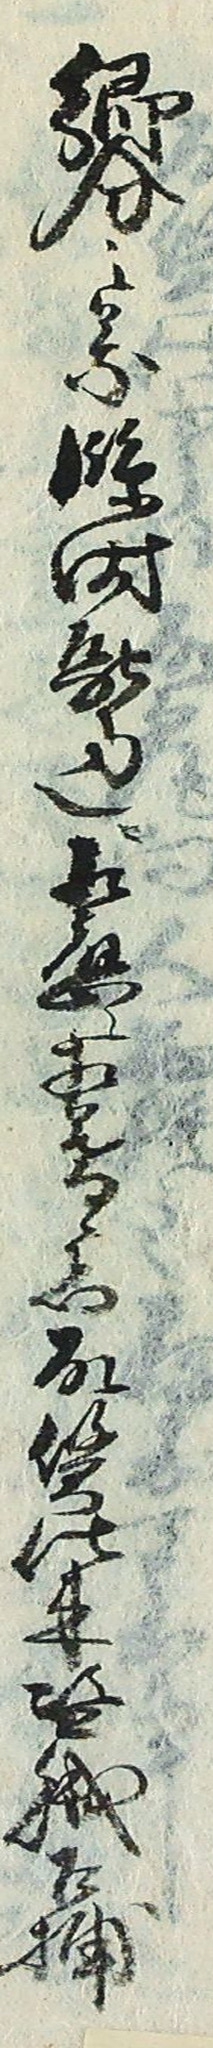郷分之義臨時融通ニ相應ニ相見暮候者取質仕来盗賊召捕
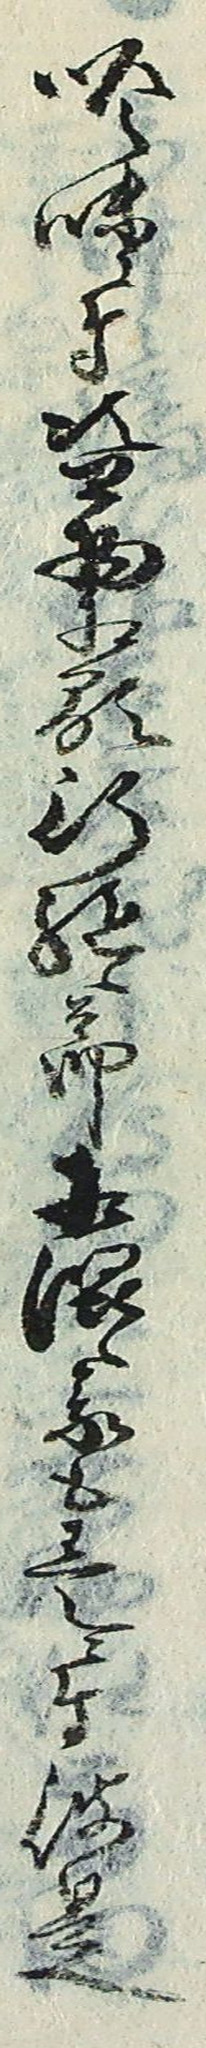吟味ニ付盗物相顕行絶候節相混候義も有之ニ付彼是
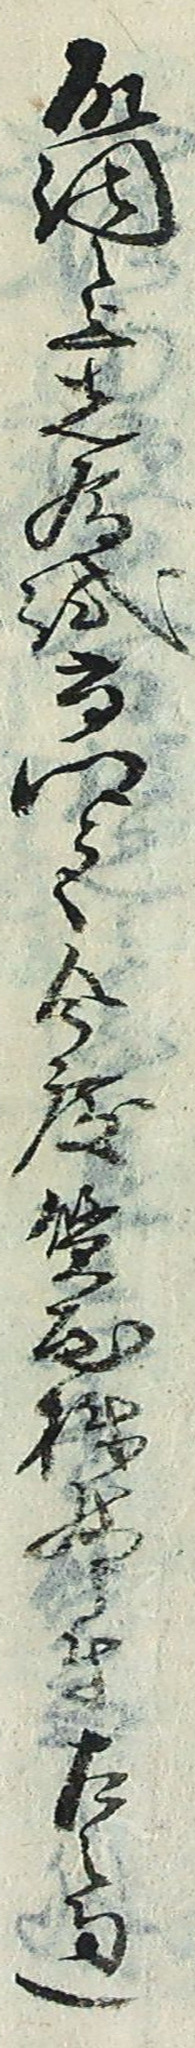取調之上先為試市郷とも今度質屋株居申付左之通
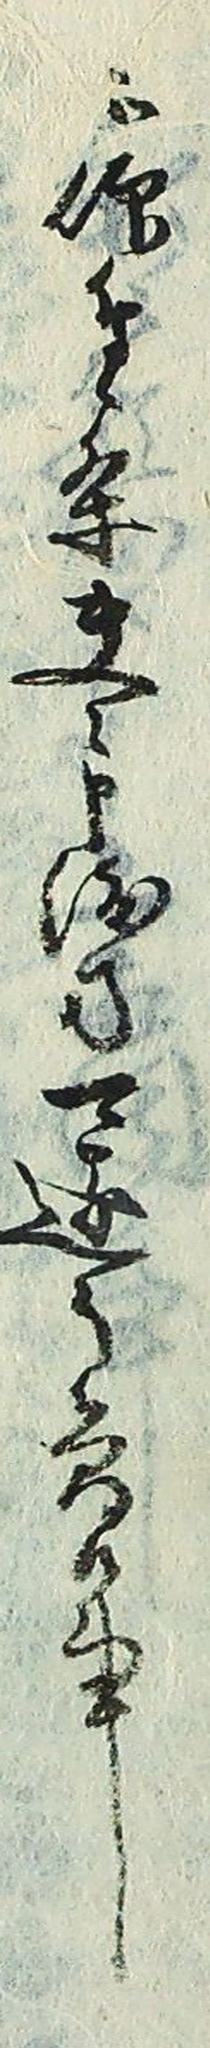被仰付候条夫々申渡方可遂了簡候事
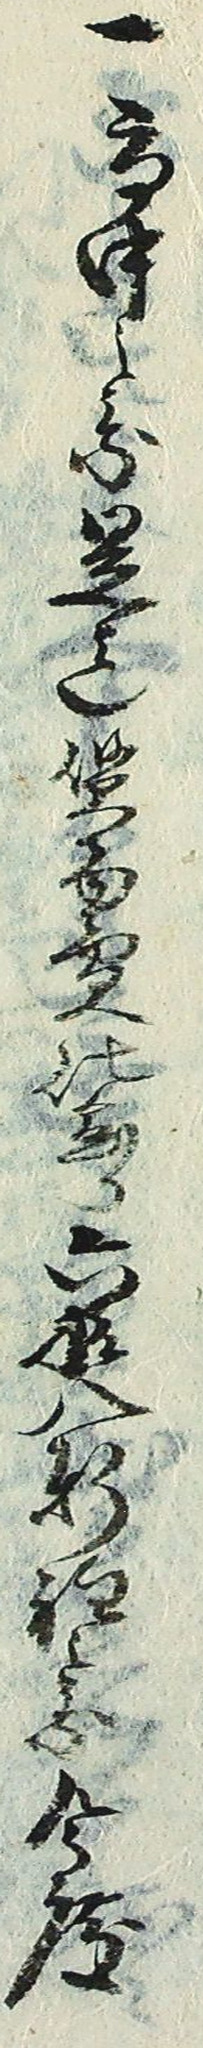一市中之義是迄質商賣仕懸り六拾八軒程之義今度
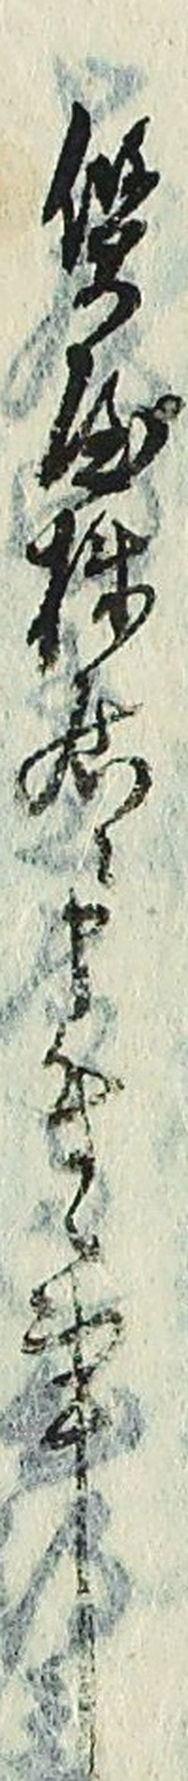質屋株居ニ申付候事
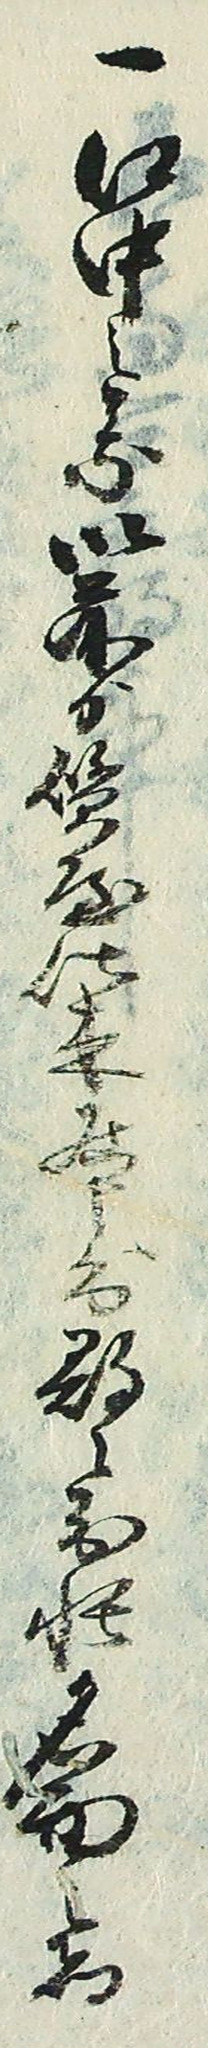一郷中之義以前ゟ質屋仕来居申分郡之別帳名面之者
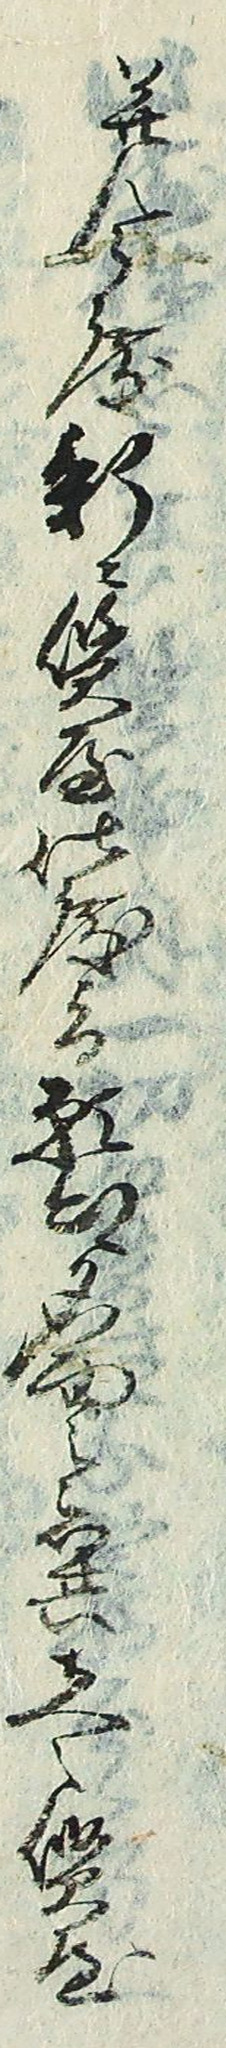幷今度新ニ質屋仕度旨願出候名面之者共夫々質屋
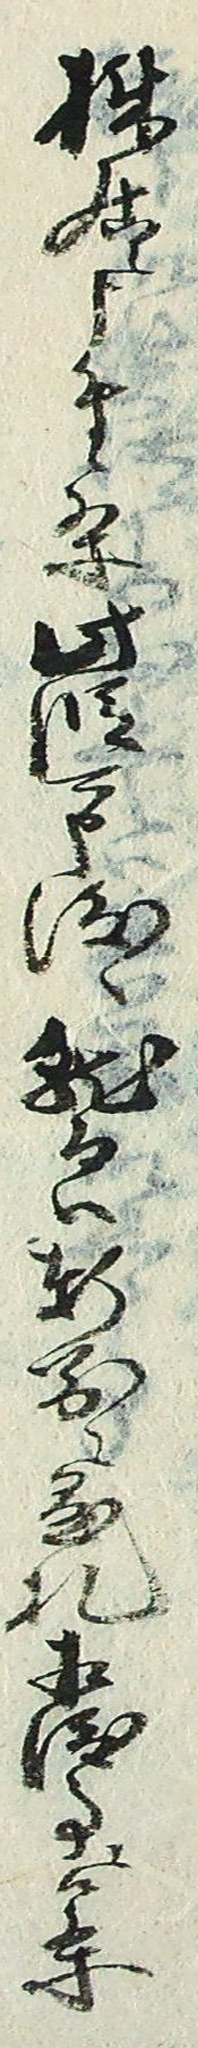株居ニ申付候条此段可申渡候就而ハ軒別ニ懸札相渡事ニ候条
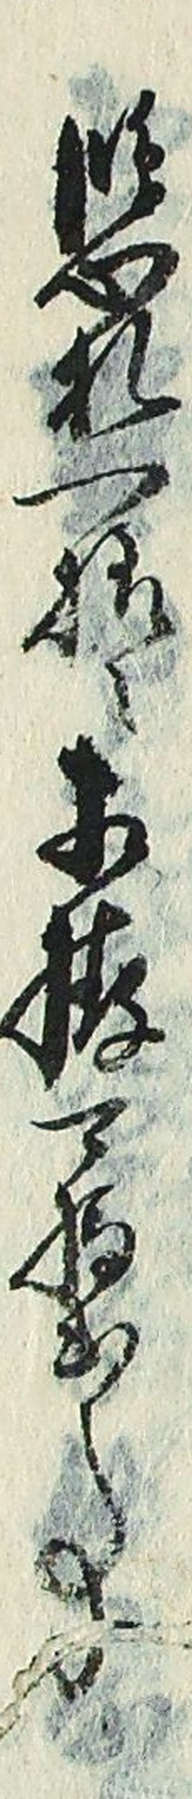懸札一様ニ相拵可指出事
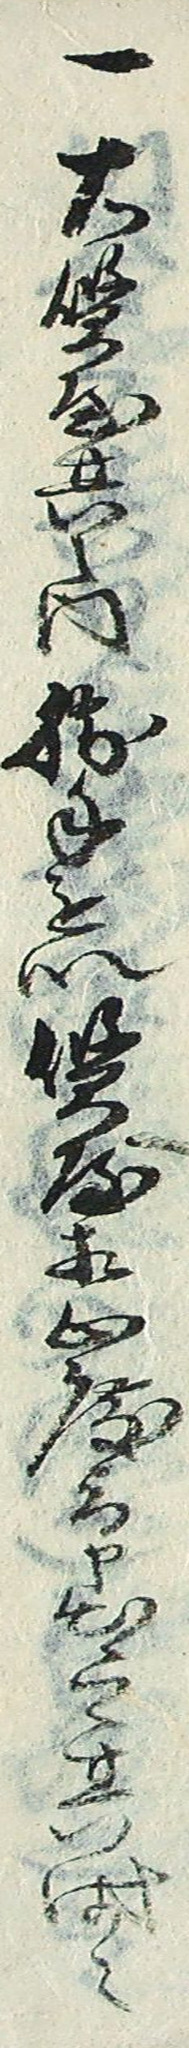一右質屋共之内勝手を以質屋相止度旨申出候ハヽ其時之
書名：市郷質屋株御取究並御書出御趣法之写
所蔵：鳴門教育大学 Naruto University of Education
